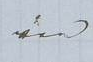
hier –
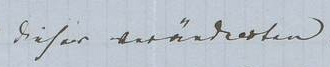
dieser veränderten
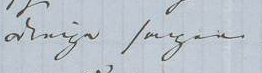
Dinge sagen –
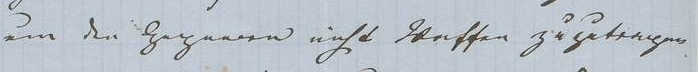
um den Gegnern nicht Waffen zuzutragen.
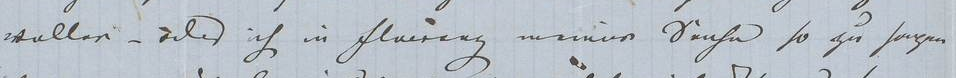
voller – als ich in Florenz meiner Sache so zu sagen
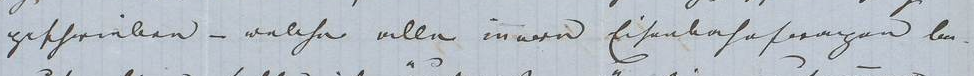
geschrieben – welche alle innern Eisenbahnfragen be-
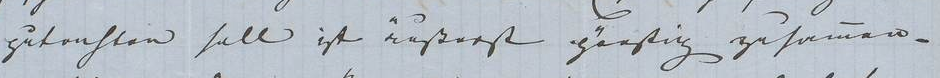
gutachten soll ist äußerst günstig zusammen-
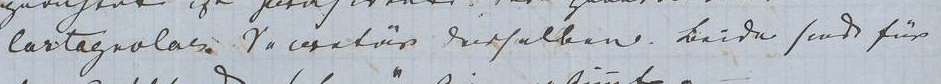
Castagnolas Secretär desselben. Beide sind für
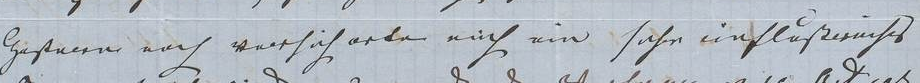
Gestern noch versicherte mich ein sehr einflußreiches
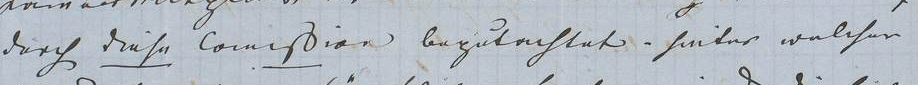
durch dieseComission begutachtet – hinter welcher
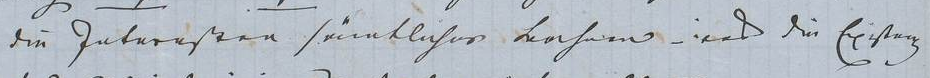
die Intereßen sämtlicher Bahnen – und die Existenz
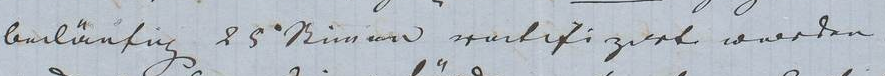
beiläufig 25 Stimmen ratifizirt werden
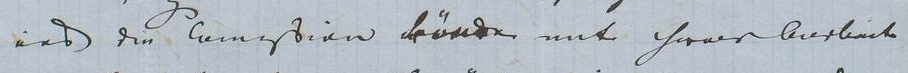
und die Comission könte mit ihrer Arbeit
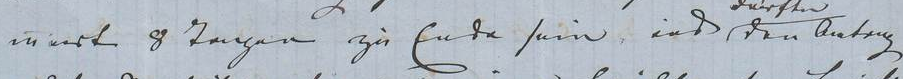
innert 8 Tagen zu Ende sein, und dürfte den Antrag
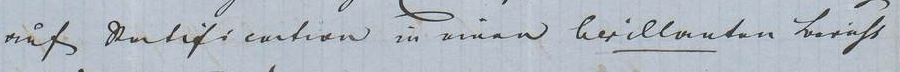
auf Ratification in einen brillanten Bericht
